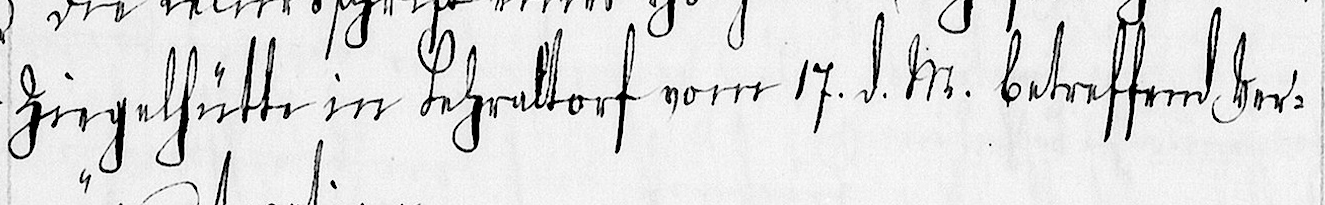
Ziegelhütte in Fehraltorf vom 17. d. M. betreffend Ve¬
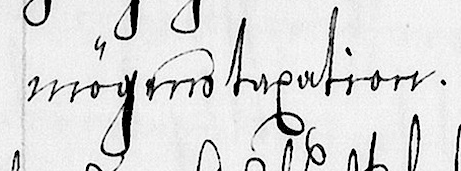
rmögenstaxation.
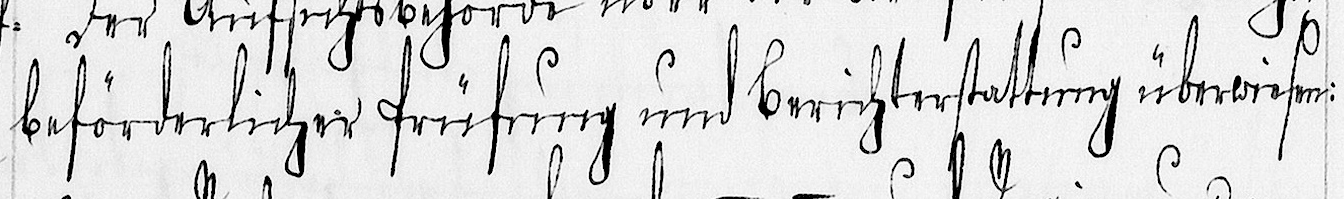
beförderlicher Prüfung und Berichterstattung überwie¬
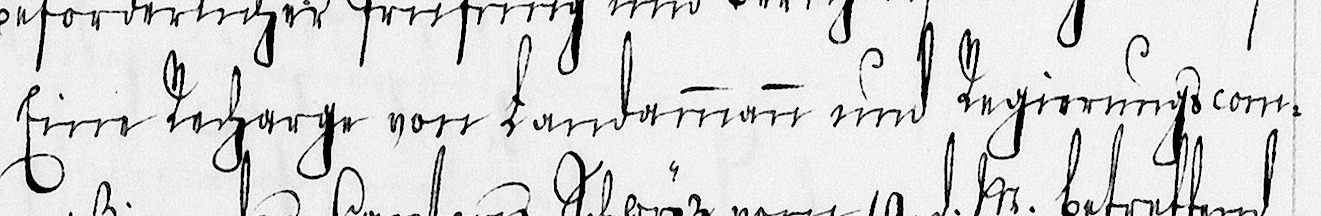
Eine Recharge von Landammann und Regierungscom¬
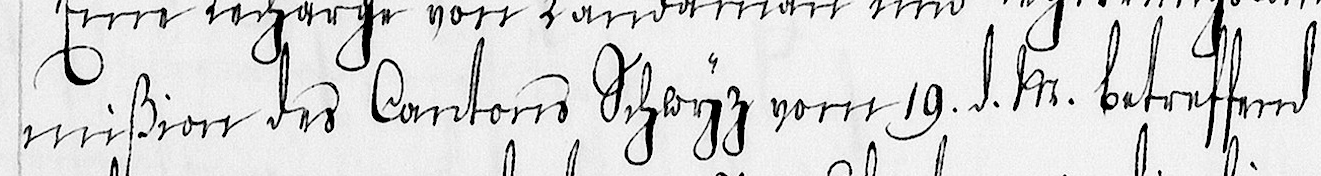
mißion des Cantons Schwyz vom 19. d. M. betreffend
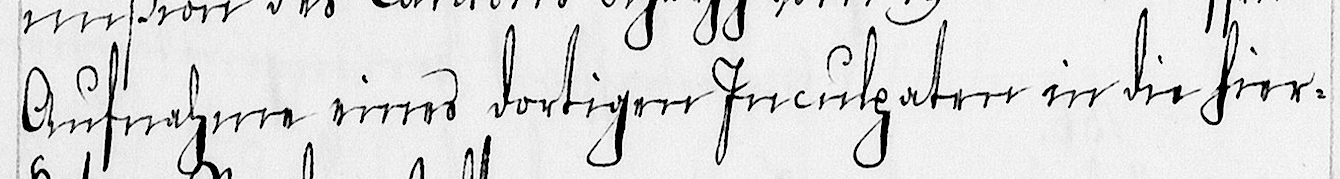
Aufnahme eines dortigen Inculpaten in die hier¬
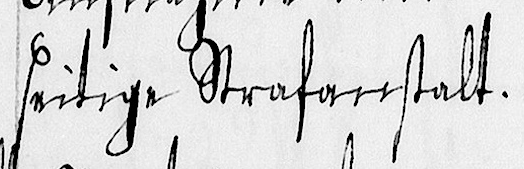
seitige Strafanstalt.
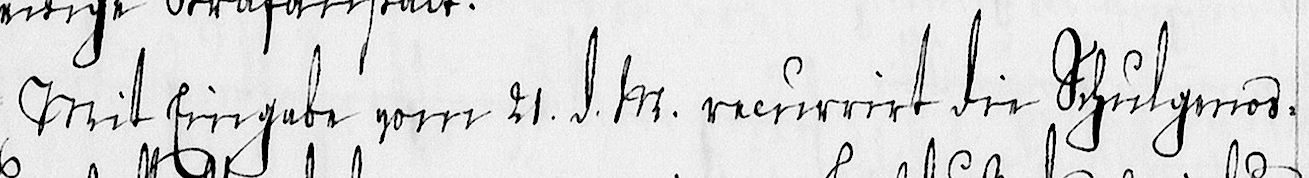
Mit Eingabe vom 21. d. M. recurrirt die Schulgenoß¬
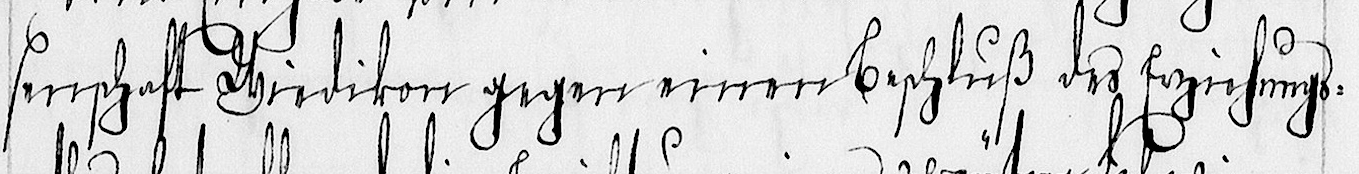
enschaft Wiedikon gegen einen Beschluß des Erziehungs¬
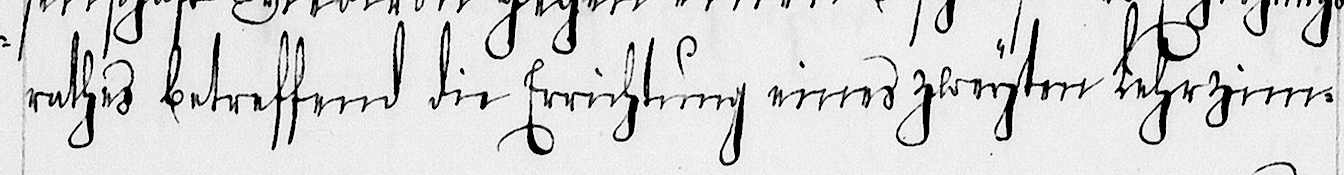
rathes betreffend die Errichtung eines zweyten Lehrzim-
